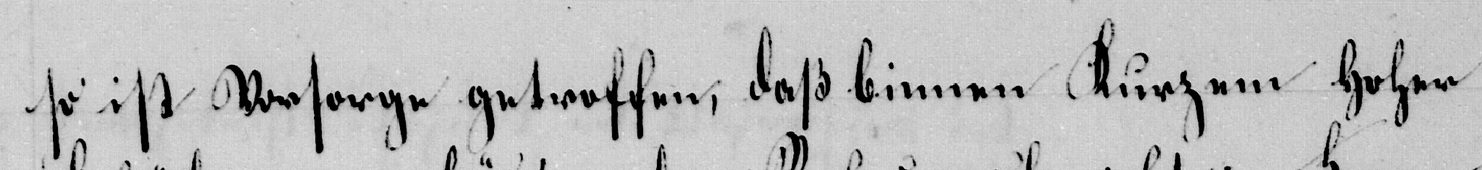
so ist Vorsorge getroffen, daß binnen Kurzem Hoher
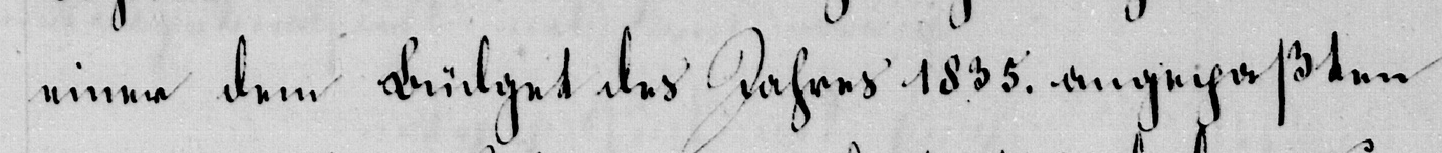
einer dem Büdget des Jahres 1835. angepaßten
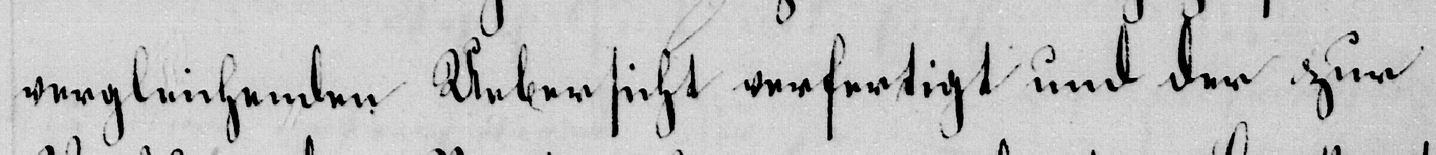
vergleichenden Uebersicht verfertigt und der zur
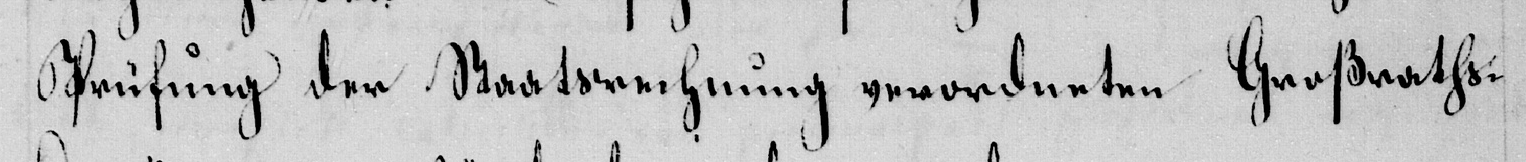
Prüfung der Staatsrechnung verordneten Großrath¬
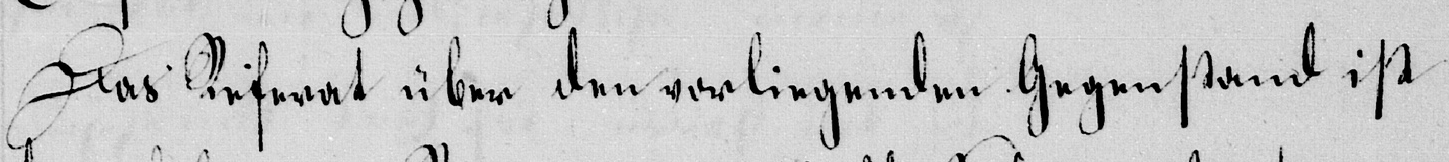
Das Referat über den vorliegenden Gegenstand ist
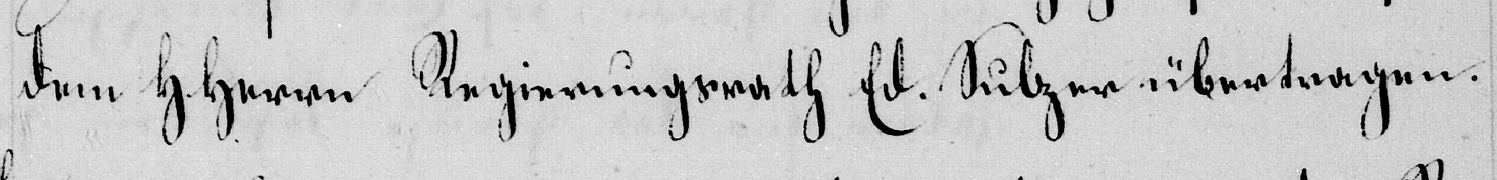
dem HHerrn Regierungsrath Ed. Sulzer übertragen.
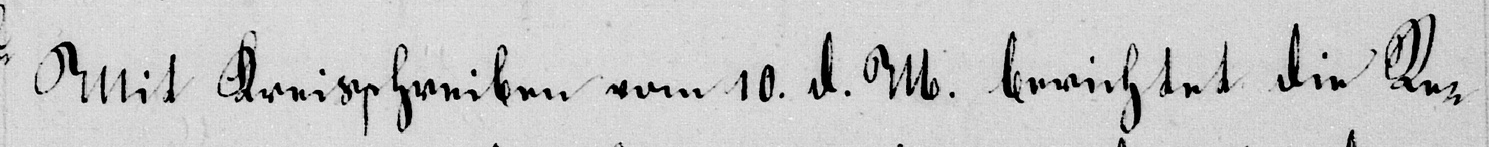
Mit Kreisschreiben vom 10. d. M. berichtet die Re¬
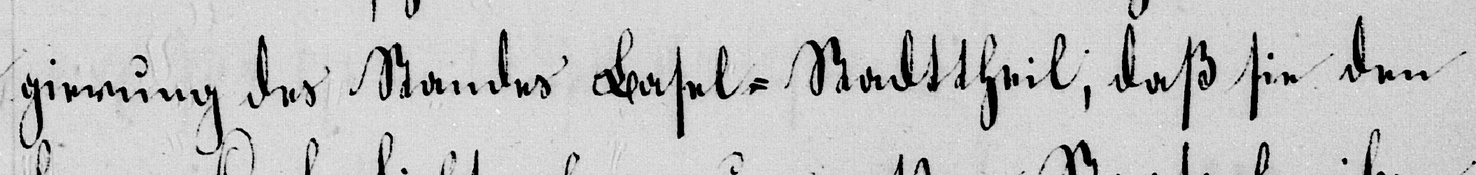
gierung des Standes Basel-Stadttheil, daß sie den
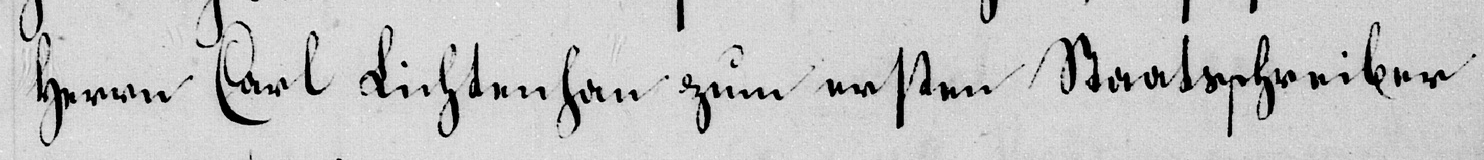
Herrn Carl Lichtenhan zum ersten Staatsschreiber
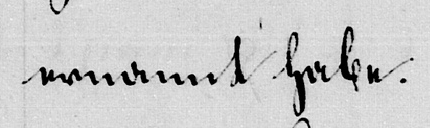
ernannt habe.
